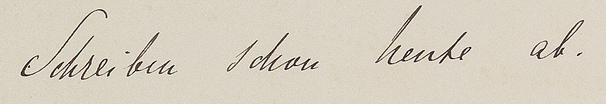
Schreiben schon heute ab.
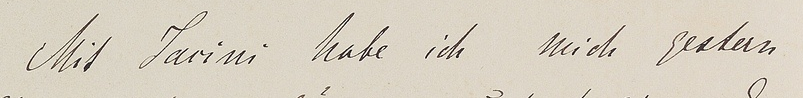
Mit Jacini habe ich mich gestern
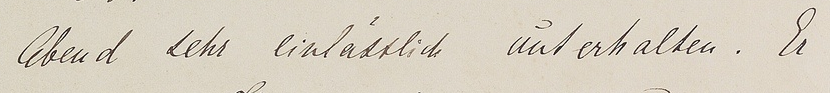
Abend sehr einlässlich unterhalten. Er
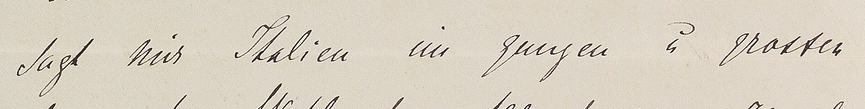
sagt mir Italien im ganzen u grossen
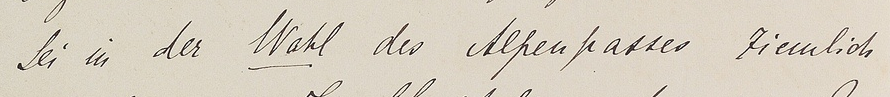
sei in der Wahl des Alpenpasses ziemlich
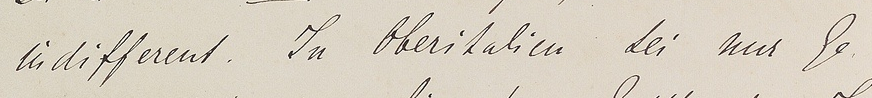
indifferent. In Oberitalien sei nur Ge-
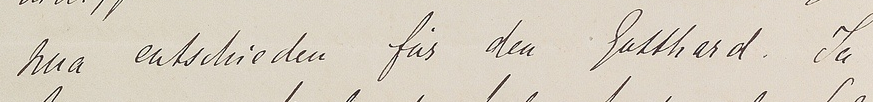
nua entschieden für den Gotthard. In
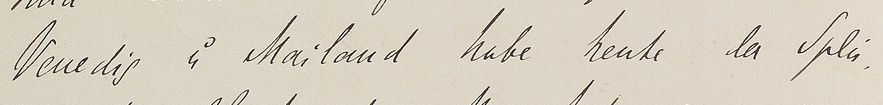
Venedig u Mailand habe heute der Splü-
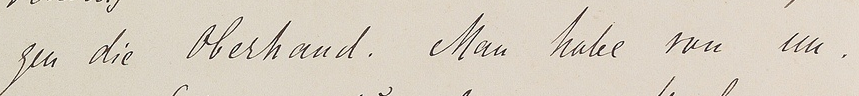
gen die Oberhand. Man habe von un-
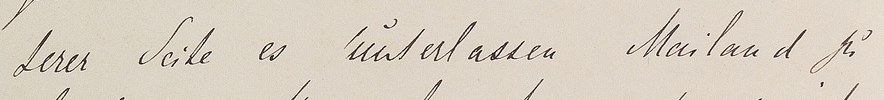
serer Seite es unterlassen Mailand zu
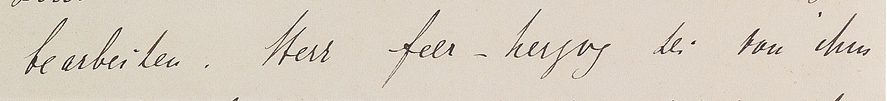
bearbeiten. Herr Feer-Herzog sei von ihm
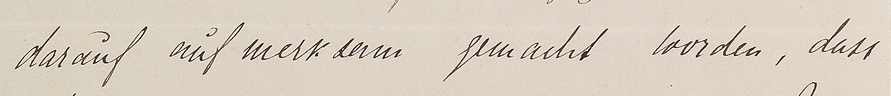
darauf aufmerksam gemacht worden, dass
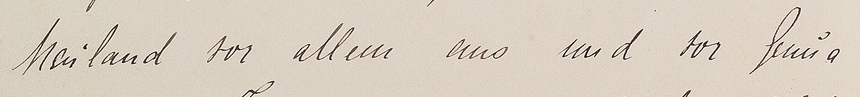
Mailand vor allem aus und vor Genua
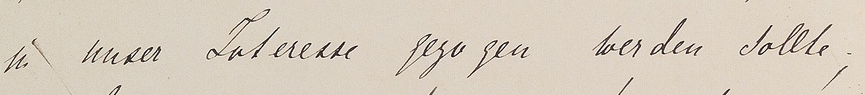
in unser Interesse gezogen werden sollte;
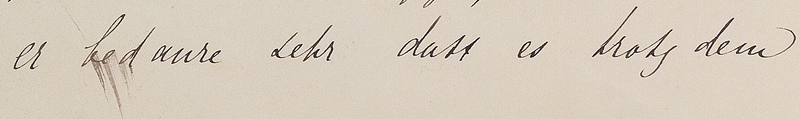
er bedaure sehr dass es trotzdem
